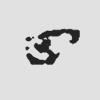日
